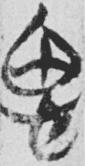思（使）
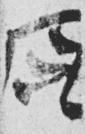反（返）
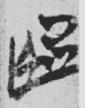躬
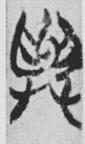與
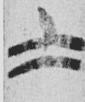士
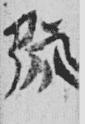處
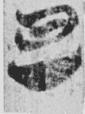旦
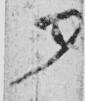夕
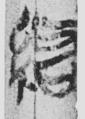○（治）
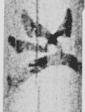之
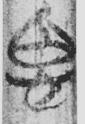思
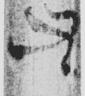又（有）
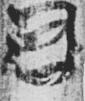君
